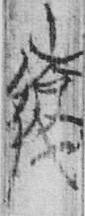○（遠）
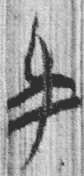与
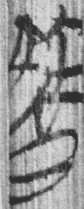○（孰）
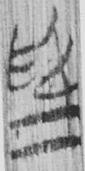爲
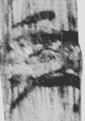天
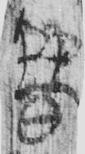○（孰）
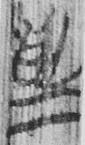爲
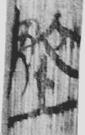○（地）
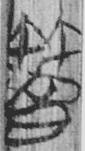○（孰）
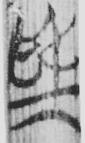爲
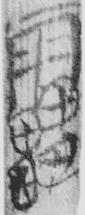靁（雷）
